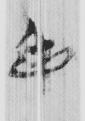身
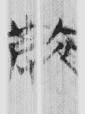被
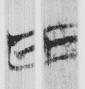甲
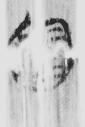{冃由}
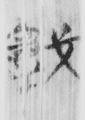{享戈}
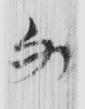力
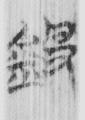{金刀又}
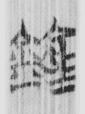鎗
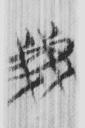疌
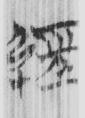弳
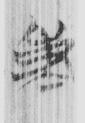秉
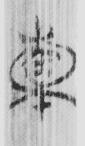㯱
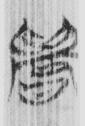{䢅日}
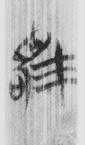鳴
